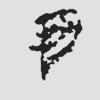朔
